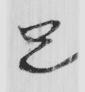巳
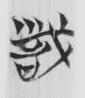{小言戈}
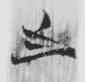之
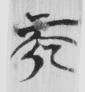而
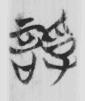{言孚}
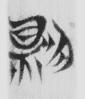則
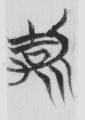劼
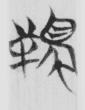{矢蜀}
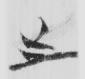之
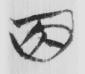因
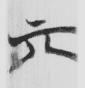亓
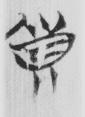貨
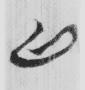㠯（以）
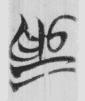爲
